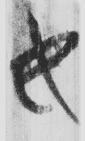母
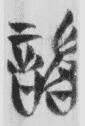{言山一王}
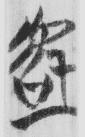唬
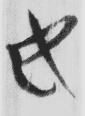女
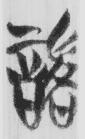{言山一王}
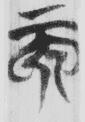而
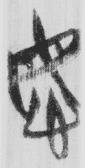悔
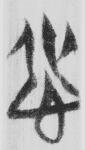{化心}
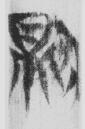則
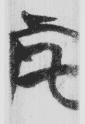厇
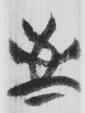至
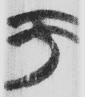于
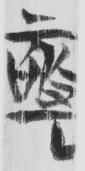亟
